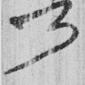乃
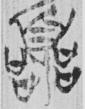囂（夭）
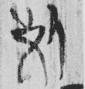死
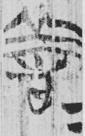善善
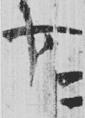才才
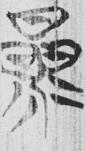參（三）
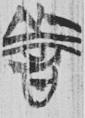善
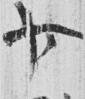才（哉）
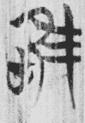唯
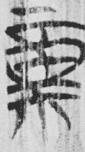福
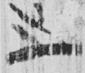之
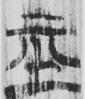○（基）
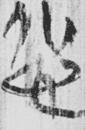○（過）
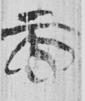而
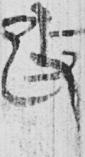改
